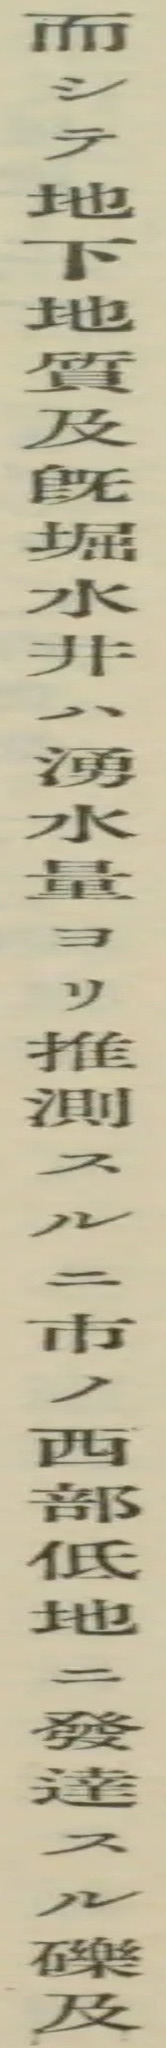而して地下地質及既堀水井は湧水量より推測するに市の西部低地に発達する礫及
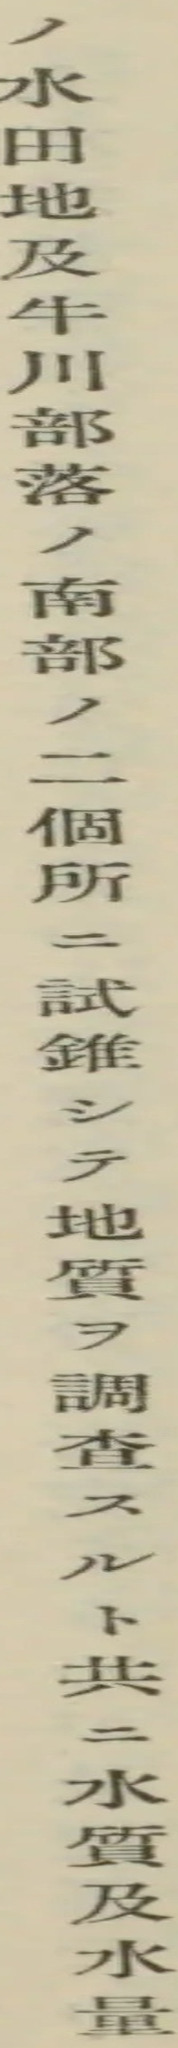の水田地及牛川部落の南部の二箇所に試錐して地質を調査すると共に水質及水量
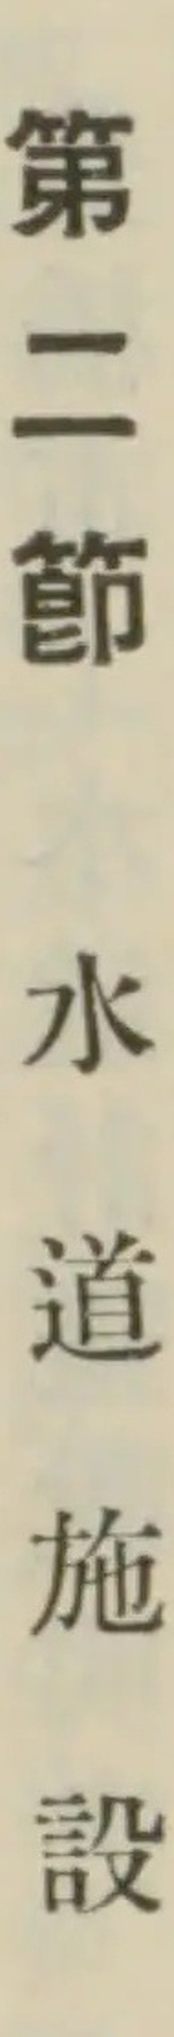第二節水道施設
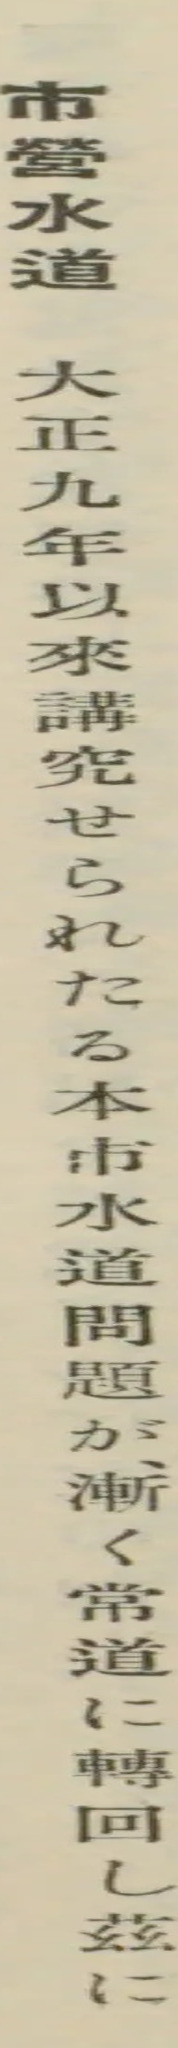市営水道大正九年以来講究せられたる本市水道問題が、漸く常道に轉回し茲に
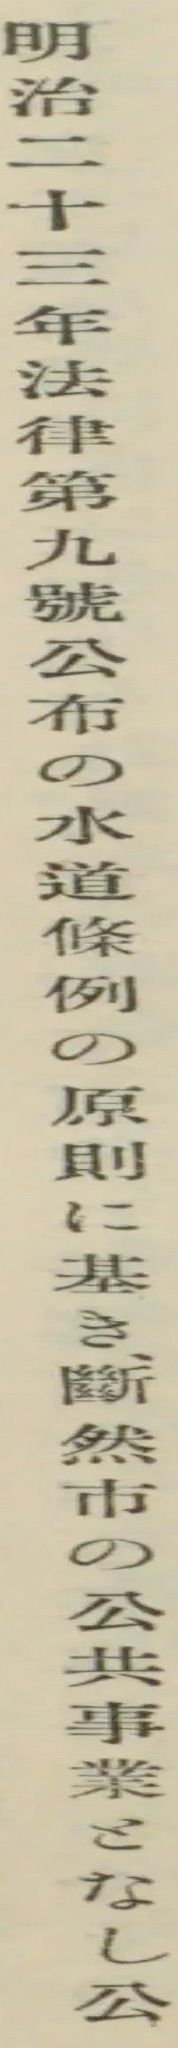明治二十三年法律第九号公布の水道条例の原則に基き、断然市の公共事業となし公
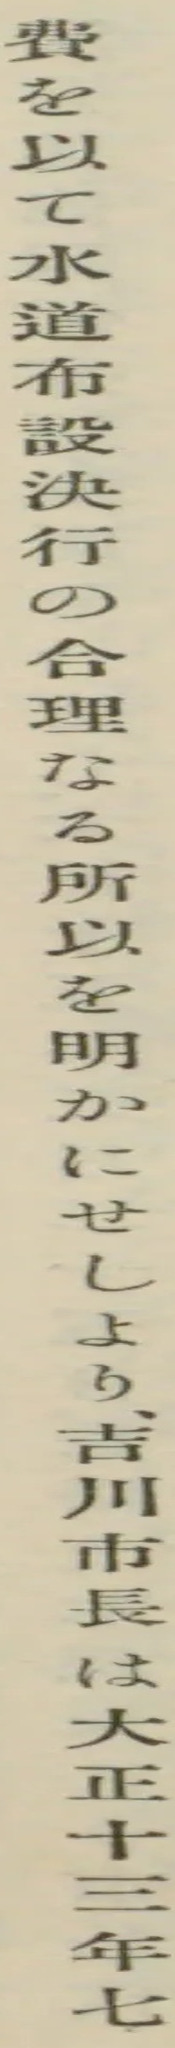費を以て水道布設決行の合理なる所以を明かにせしより、吉川市長は大正十三年七
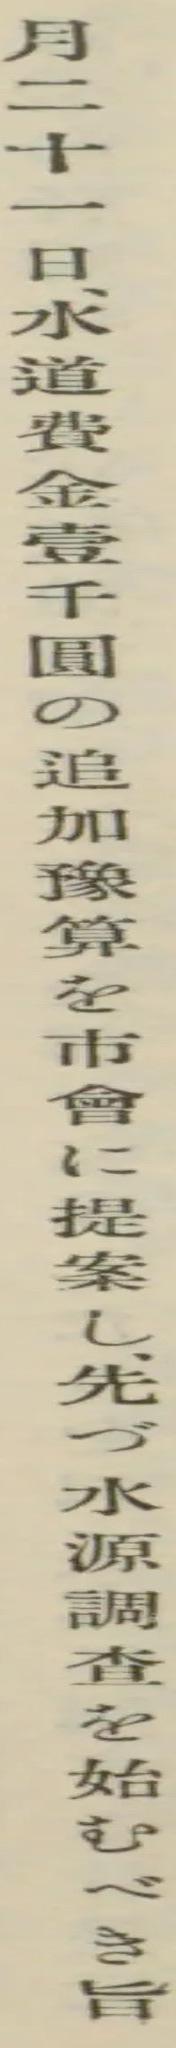月二十一日、水道費金壹千圓の追加予算を市会に提案し、先ず水源調査を始むべき旨
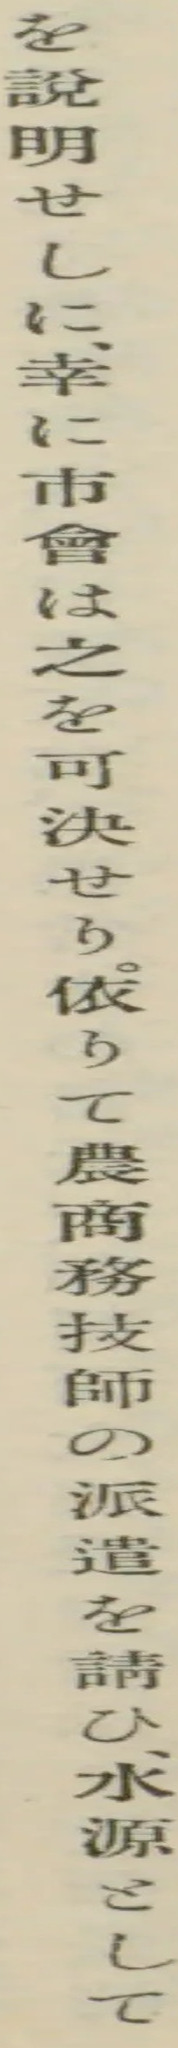を説明せしに、幸に市会は之を可決せり、依りて農商務技師の派遣を請ひ、水源として
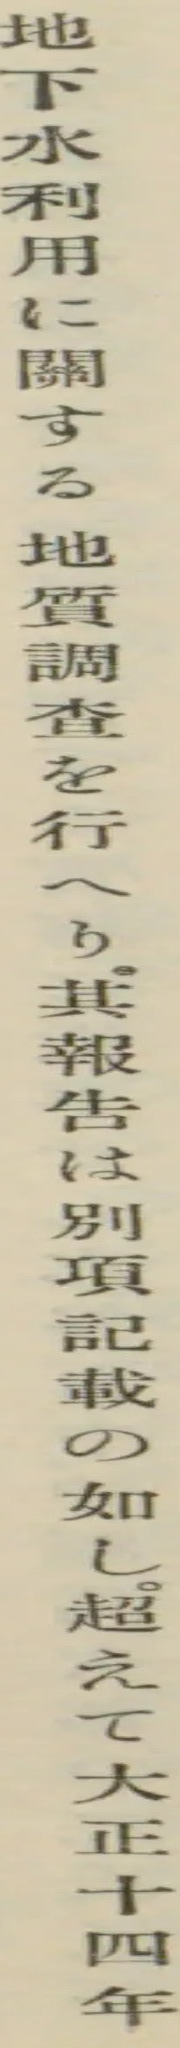地下水利用に関する地質調査を行へり。其報告は別項記載の如し。超えて大正十四年
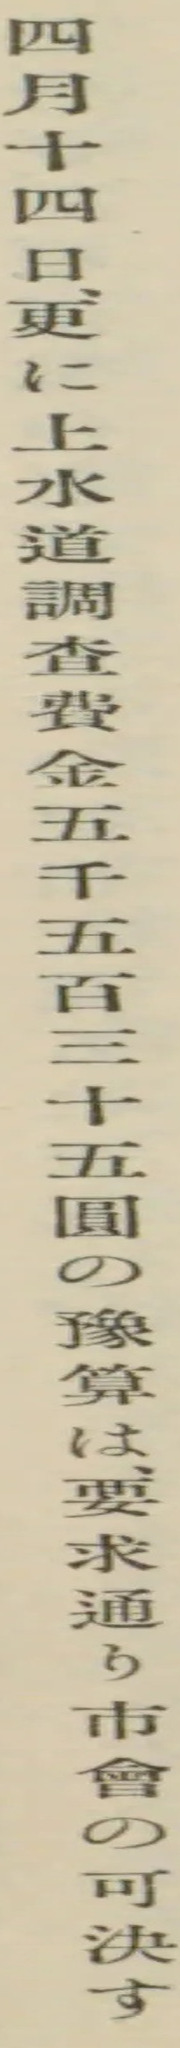四月十四日、更に上水道調査費金五千五百三十五圓の予算は、要求通り市会の可決す
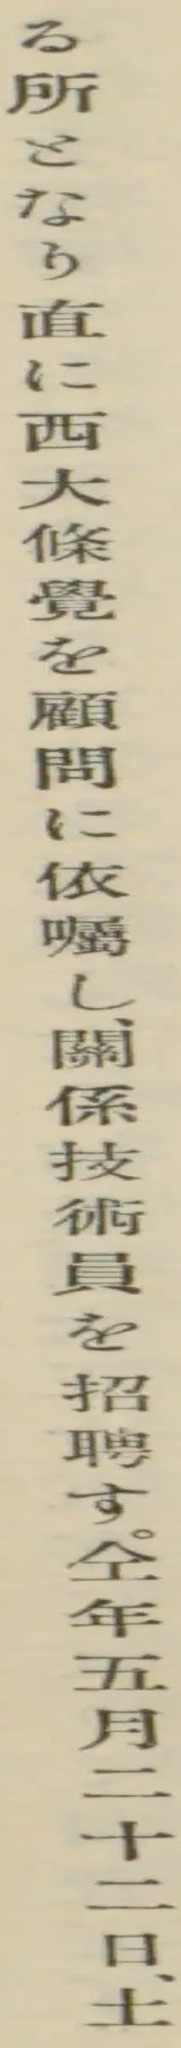る所となり直に西大條覺を顧問に依嘱し、関係義技術員を招聘す。同年五月二十二日、土
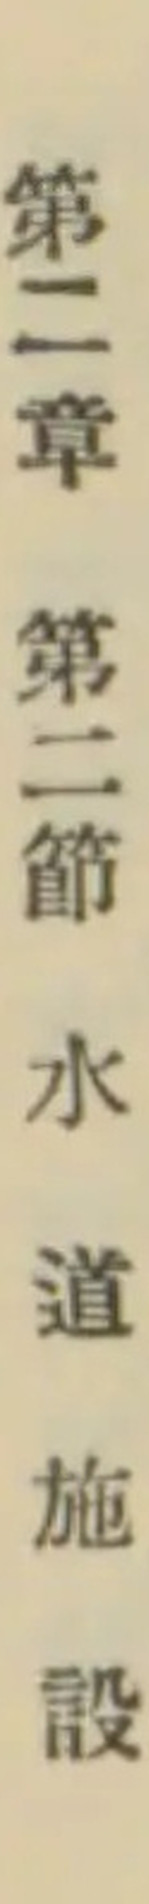第二章第二節水道施設

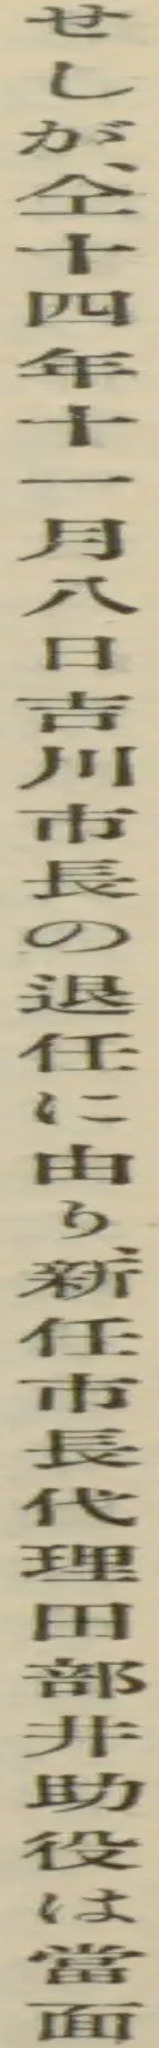せしが、同十四年十一月八日吉川市長の退任に由り、新任市長代理田部井助役は当面
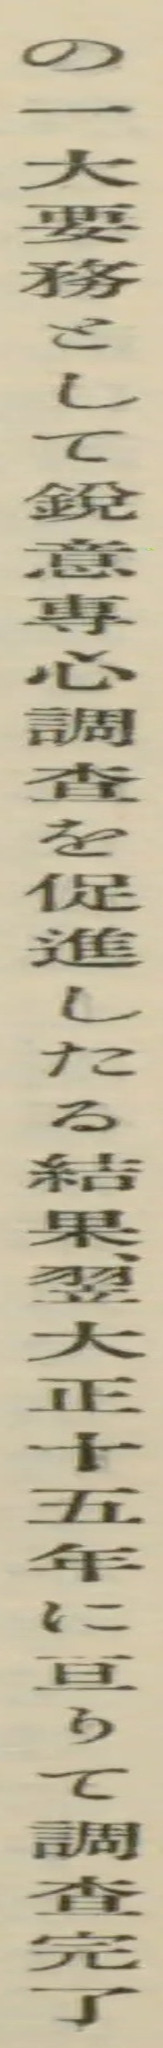の一大要務として鋭意位専心調査を促進したる結果、翌大正十五年に亘りて調査完了
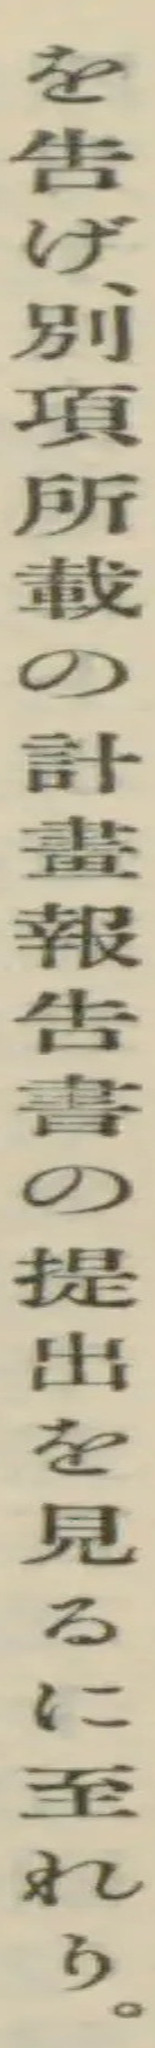を告げ、別項所載の計画報告書の提出を見るに至れり。
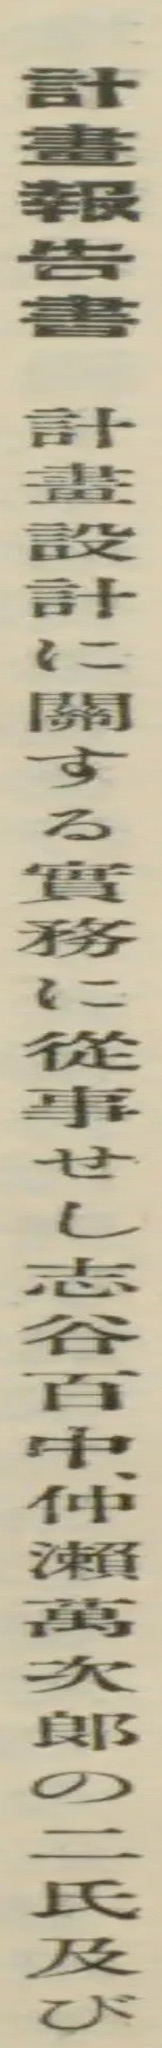計画報告書計画設計に関する実務に従事せし志谷百中、中瀬萬次郎の二氏及び
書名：豊橋市水道誌
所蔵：国立国会図書館 National Diet Library, JAPAN
